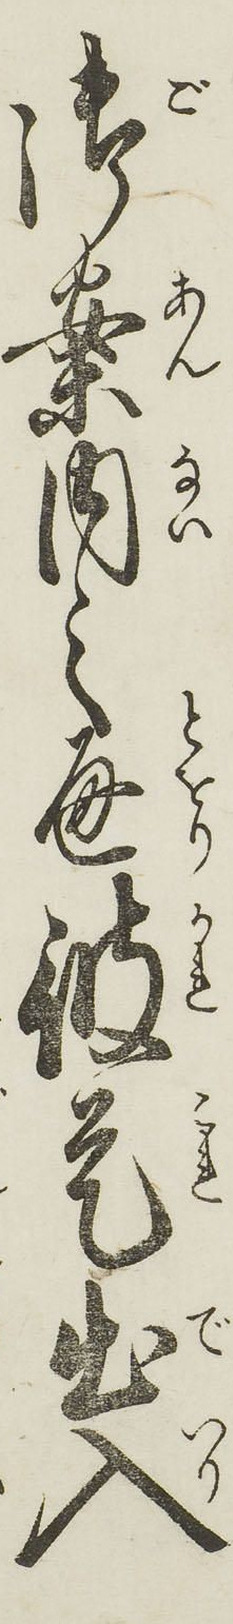御案内之通彼是出入
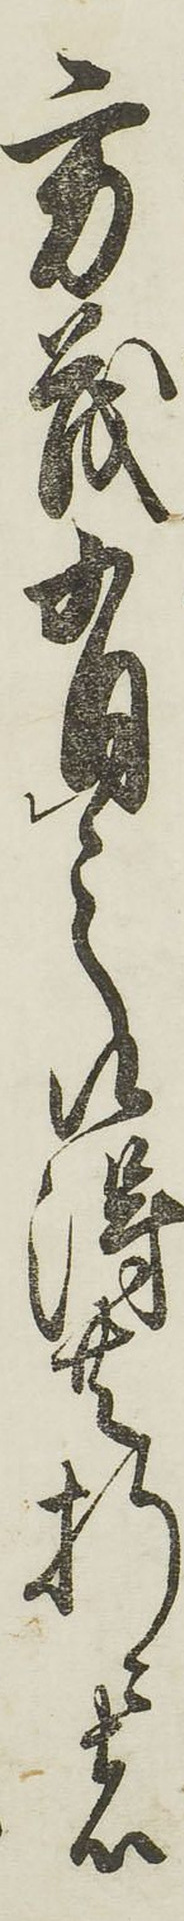方も有之候得共折者

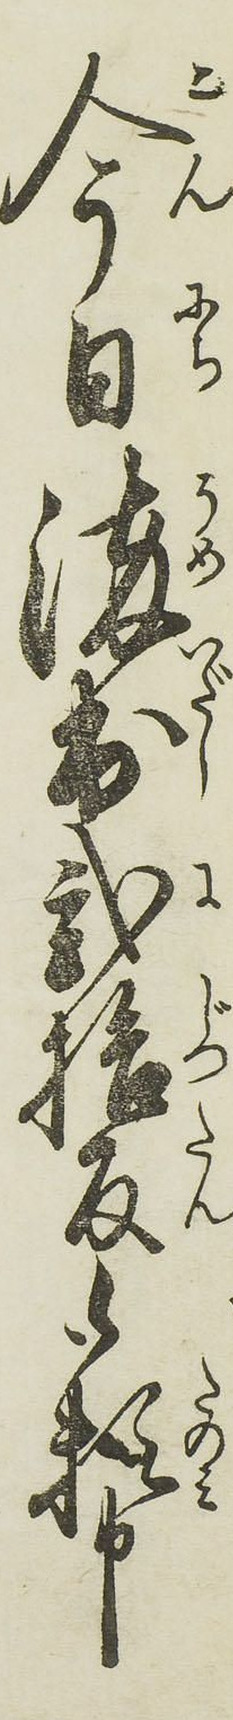今日染出弐拾反御頼申
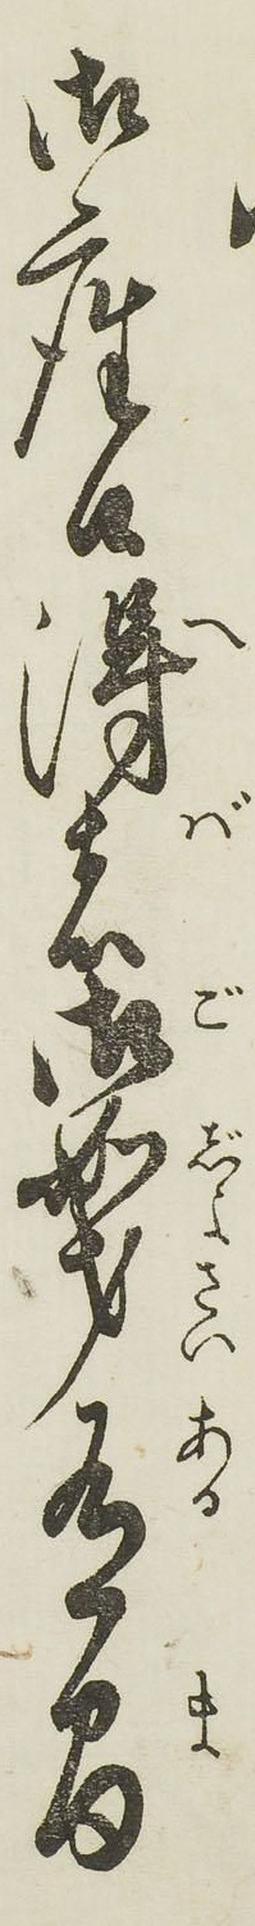御座候得者御如才有間
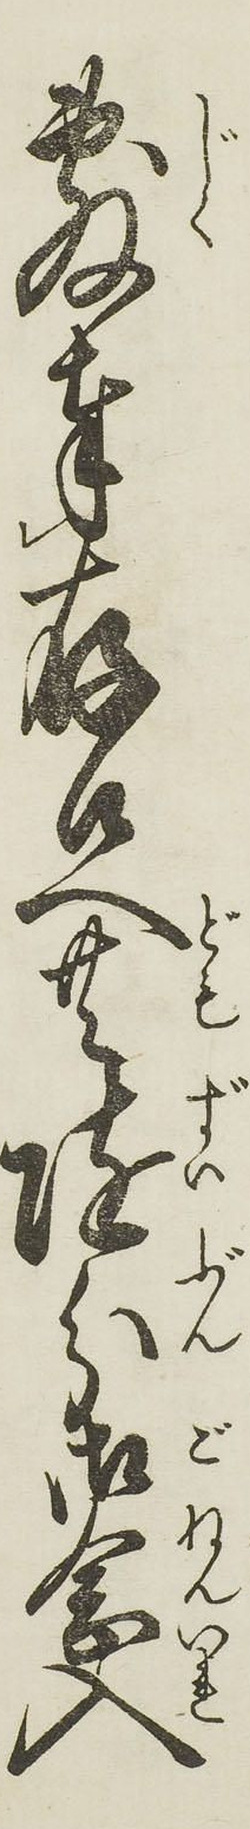敷奉存候へ共随分御念入
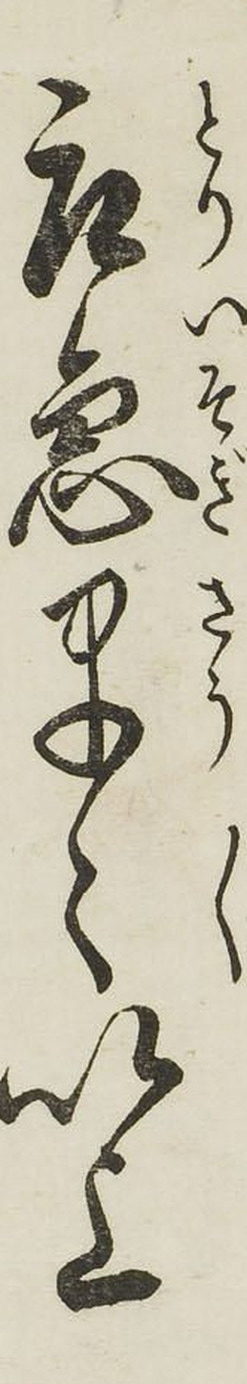取急早々以上
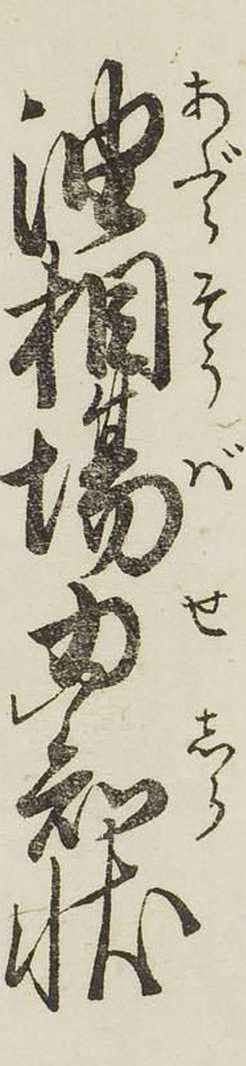油相場為知状

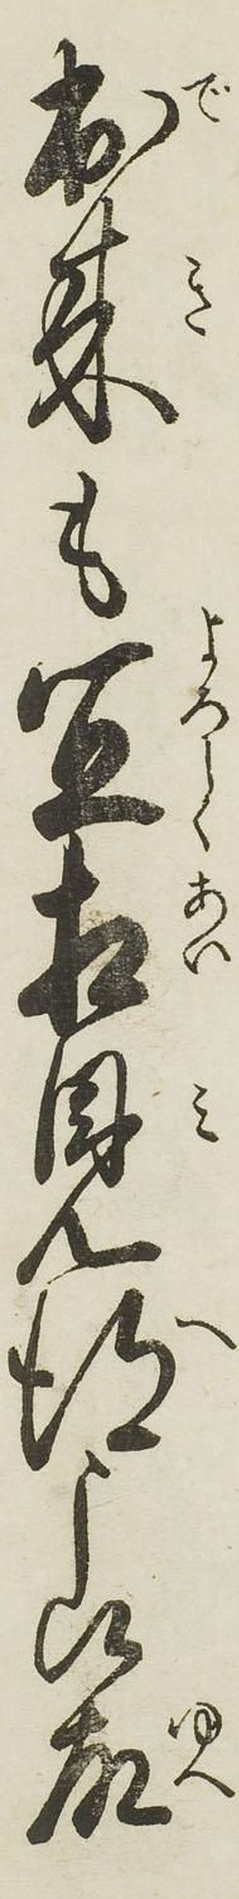出来も宜相見得し候故
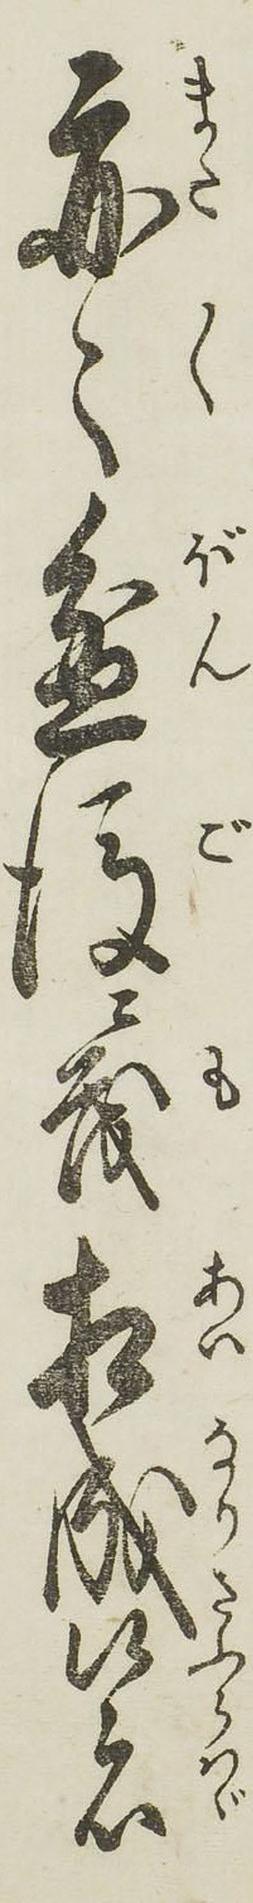亦々盆後茂相成候者

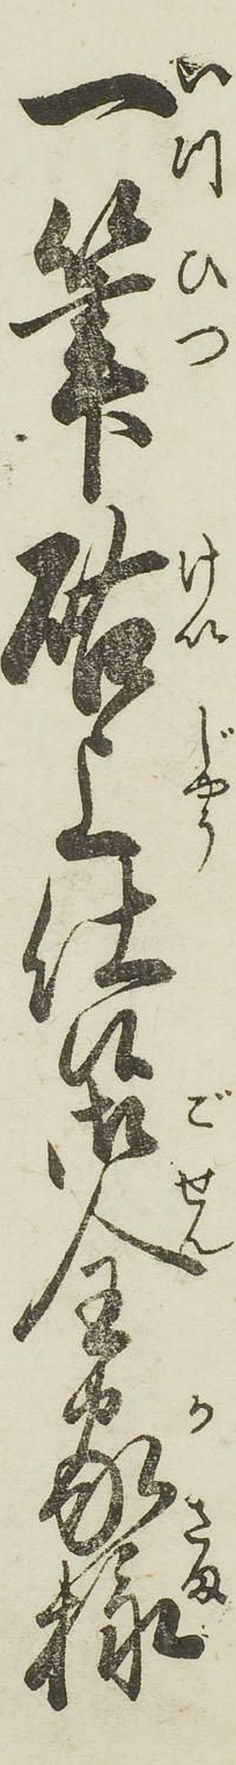一筆啓上仕候御全家様
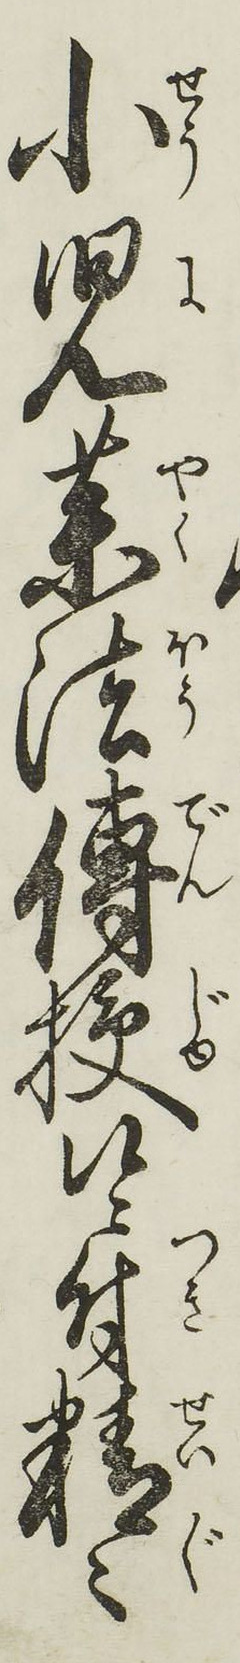小児薬法伝授候付精々

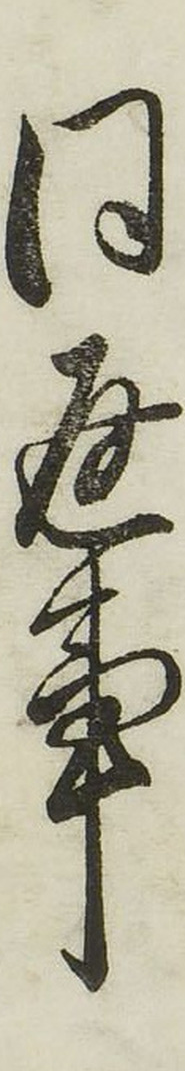同返事

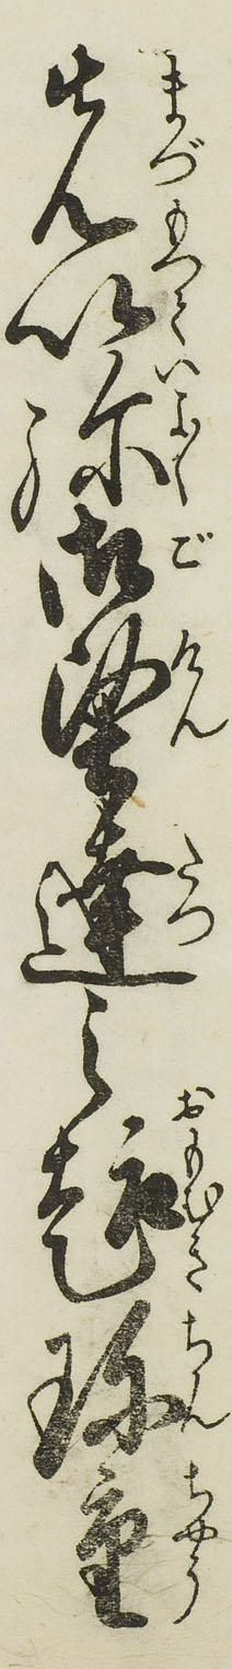先以弥御堅達之趣珍重

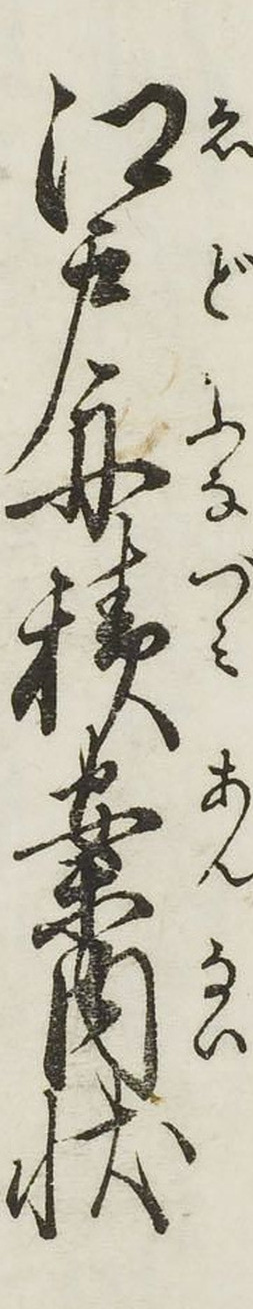江戸舟積案内状
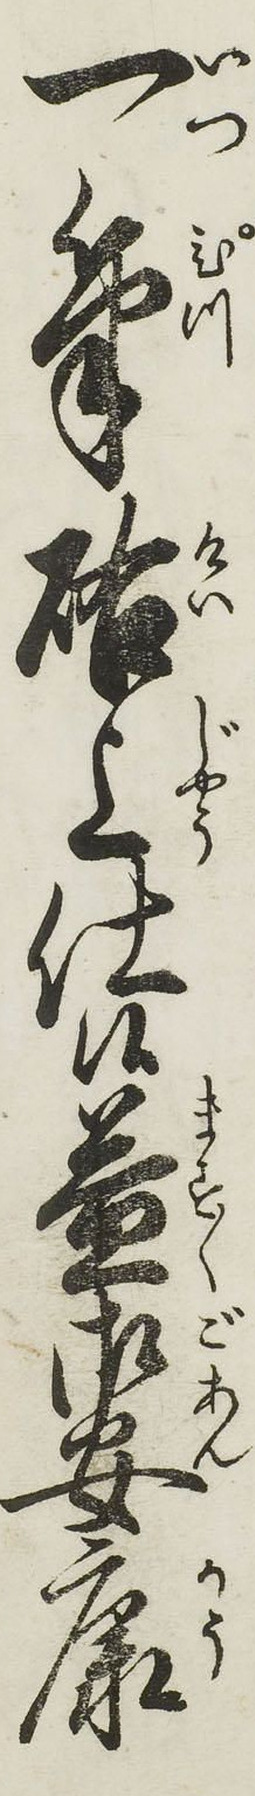一筆啓上仕候益御安康
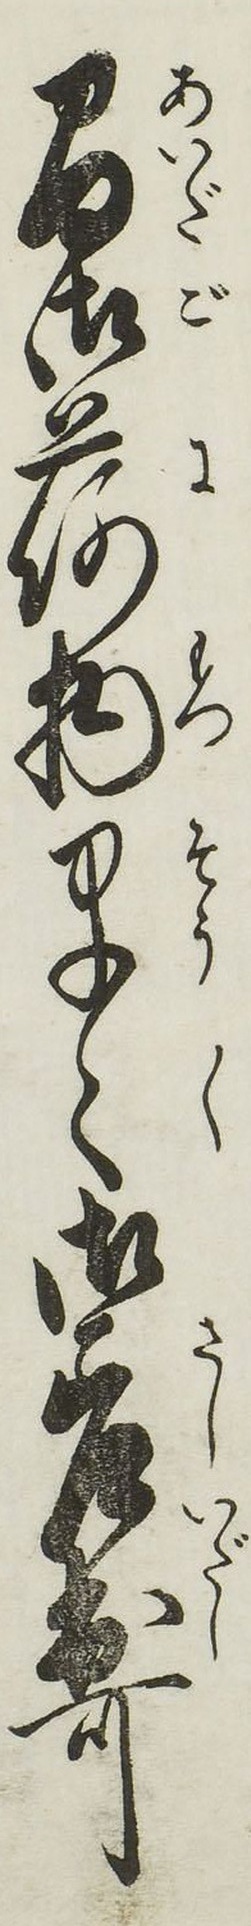間御荷物早々御差出可
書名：商人書翰便覧
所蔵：東京学芸大学教育コンテンツアーカイブ
